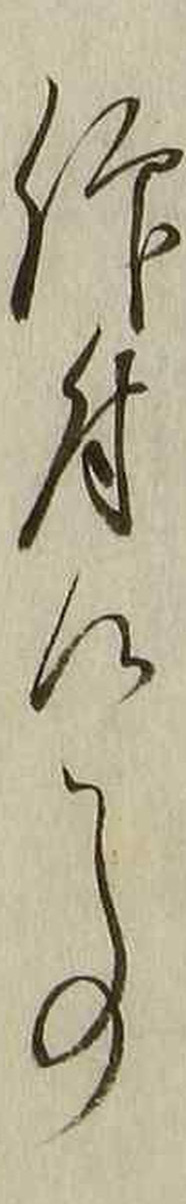仰付候事
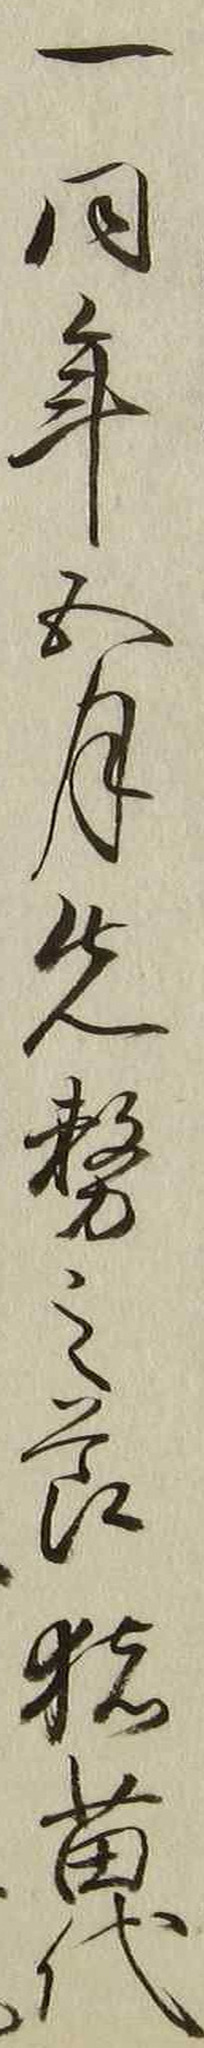一同年五月先務之節猪苗代
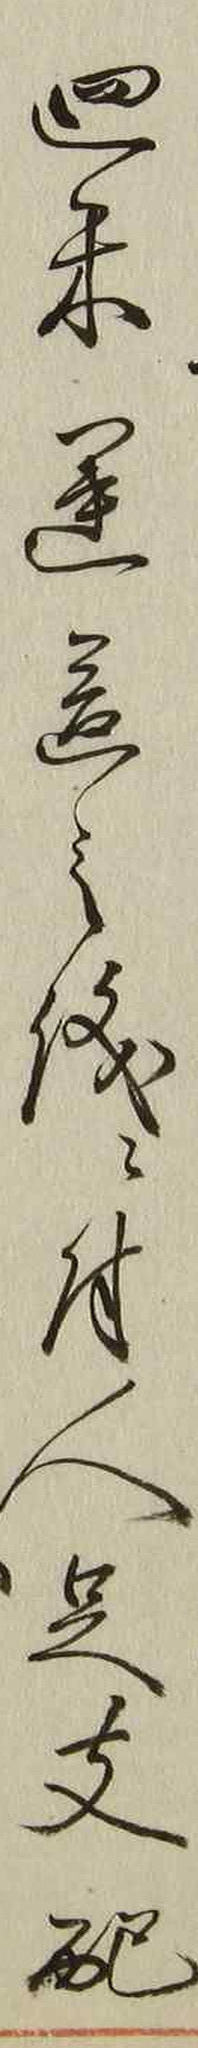廻米運道之儀ニ付人足支配
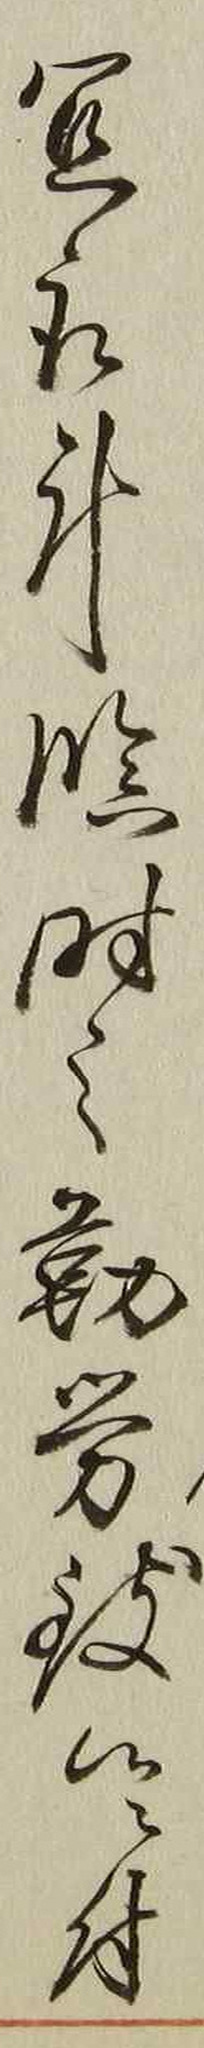宜取計臨時之勤労致候ニ付
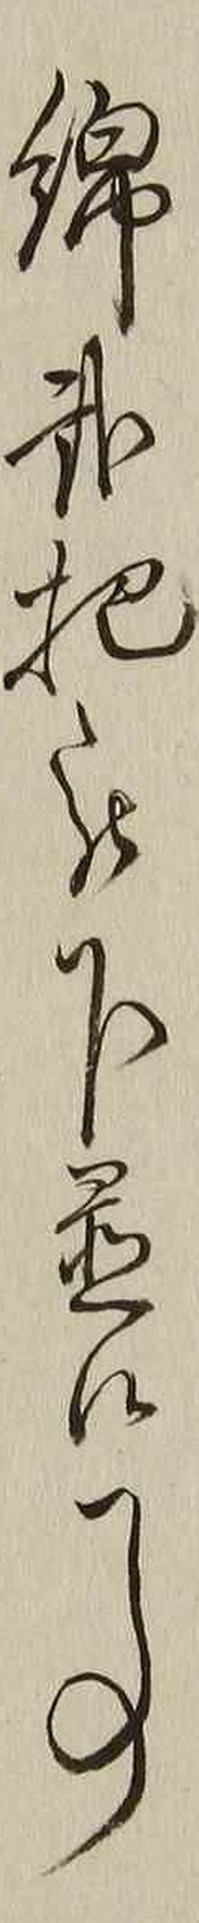綿弐把被下置候事
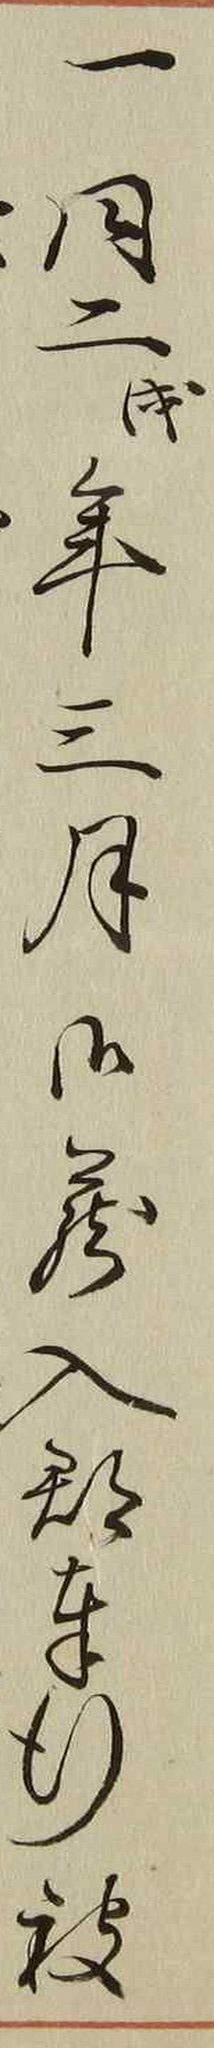一同二戌年三月御蔵入郡奉行致
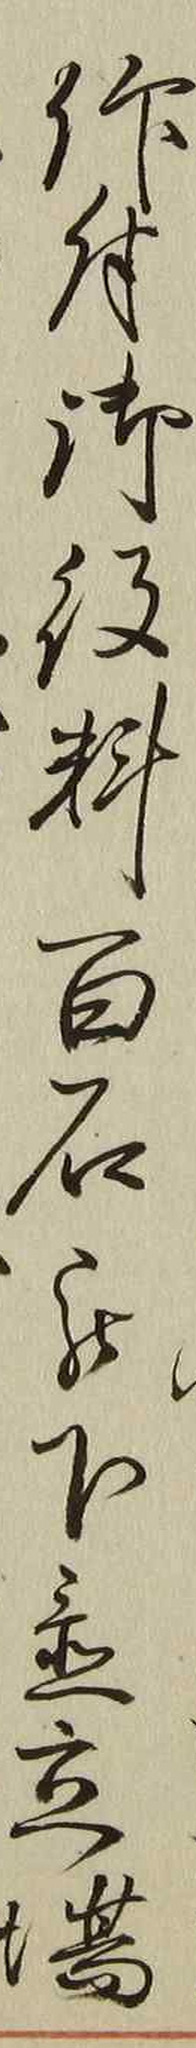仰付御役料百石被下置立場
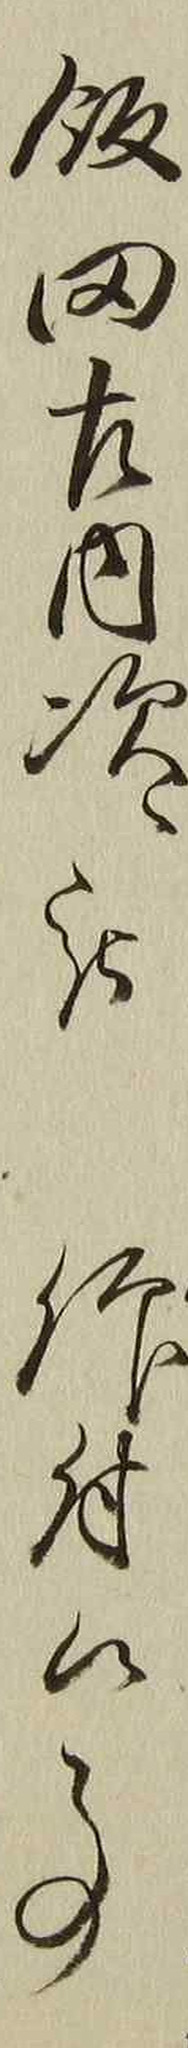飯田左内次ニ被仰付候事
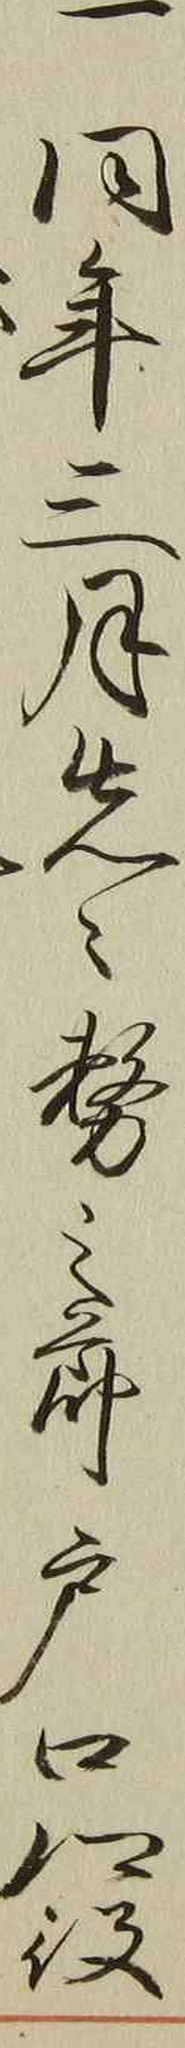一同年三月先々務之節戸口郷役
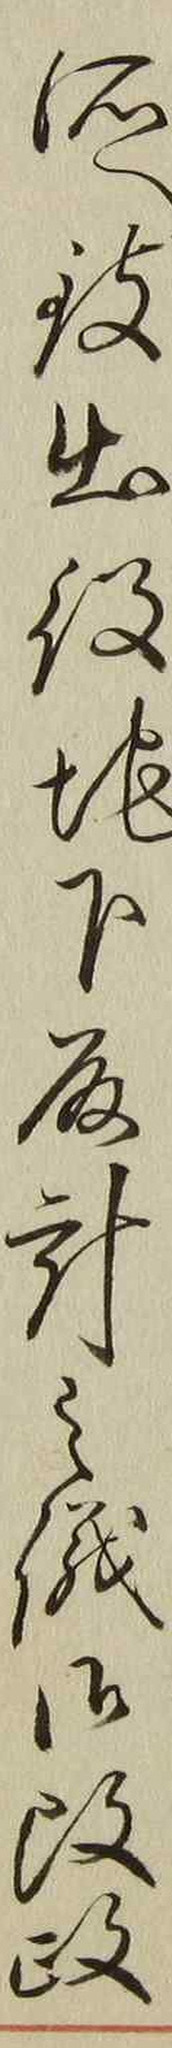所へ致出役地下取計之儀御改政
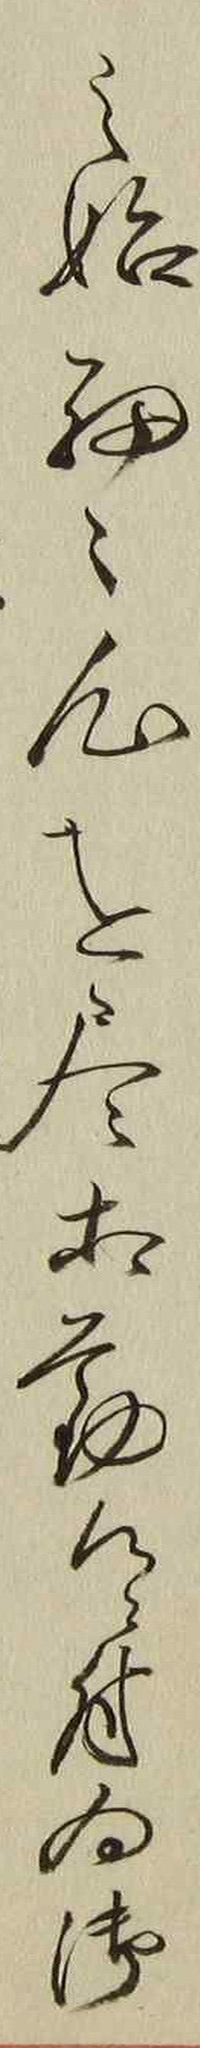之始細々心を尽相勤候ニ付為御
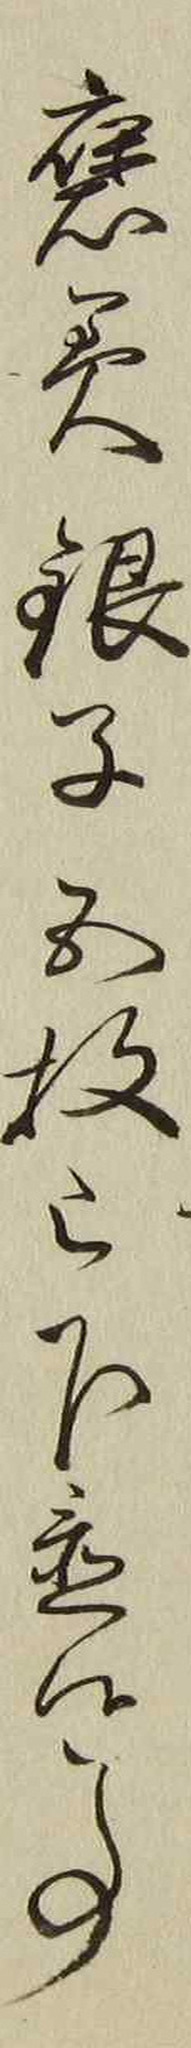褒美銀子五枚被下置候事
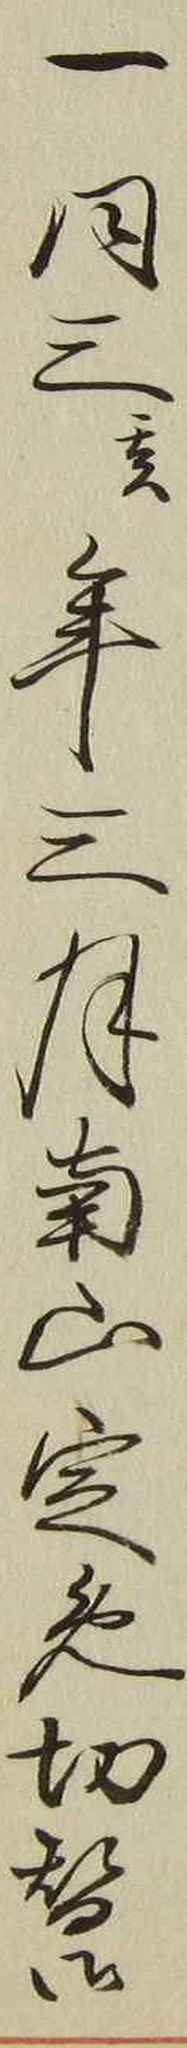一同三亥年三月南山定免切替御
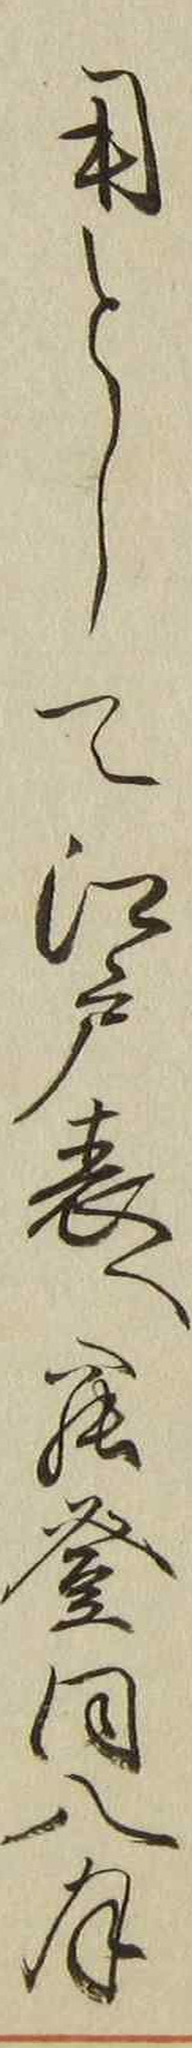用として江戸表へ罷登同八月
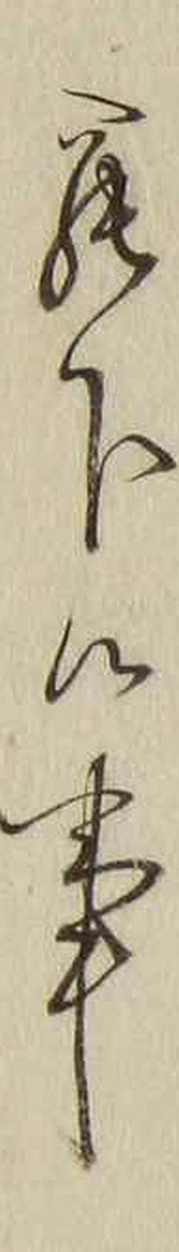罷下候事

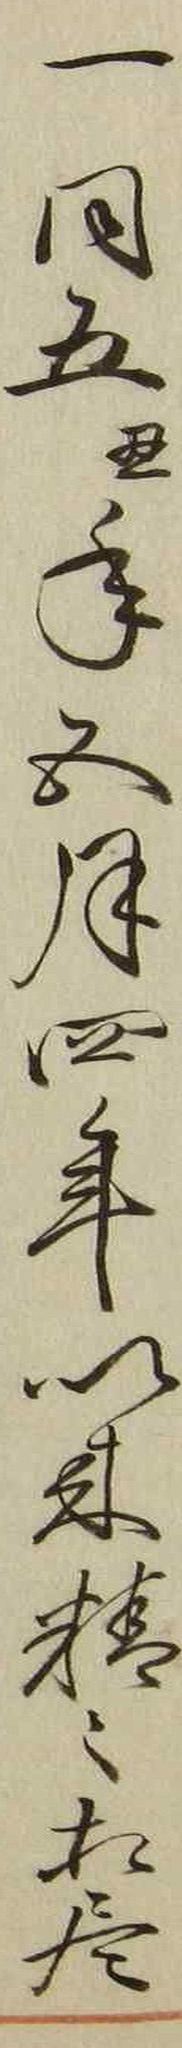一同五丑年五月四年以来精々相尽
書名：諸士系譜　巻之54　ほ之部1
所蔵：会津若松市立会津図書館
